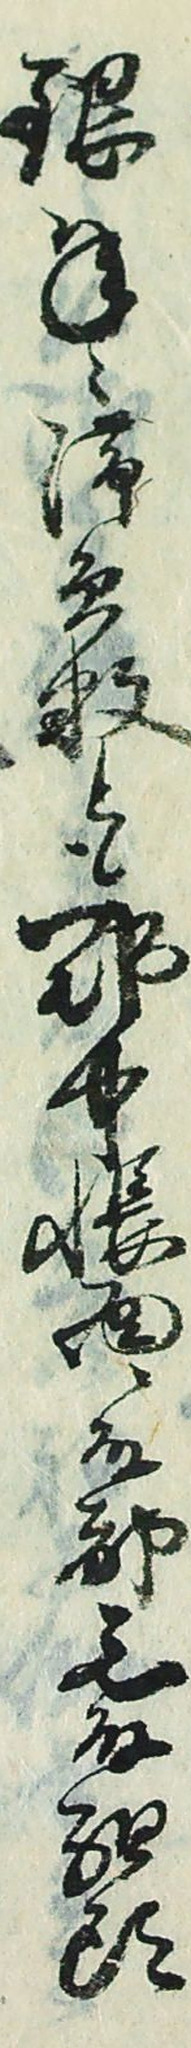銀年々滞員数とも郡中帳面ニ取都元取組頭
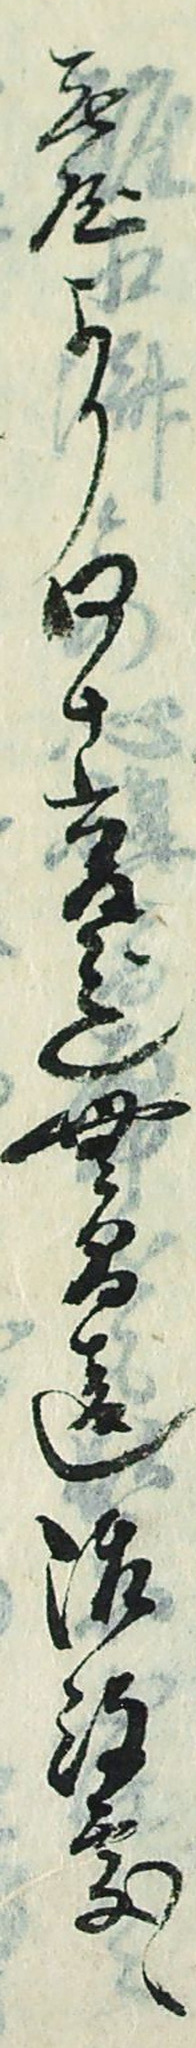庄屋より同十六日迄無間違御役處へ
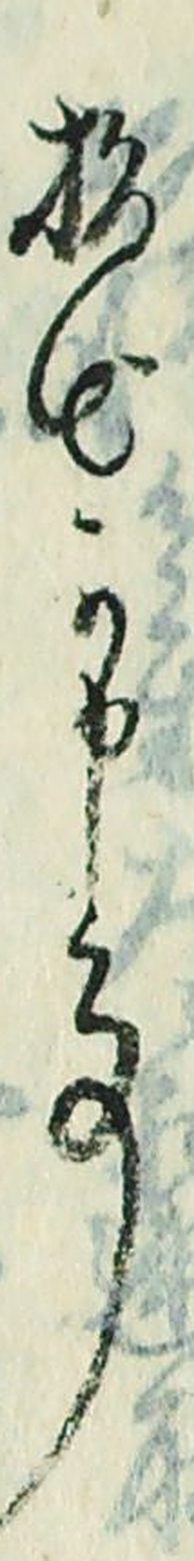指出可申事

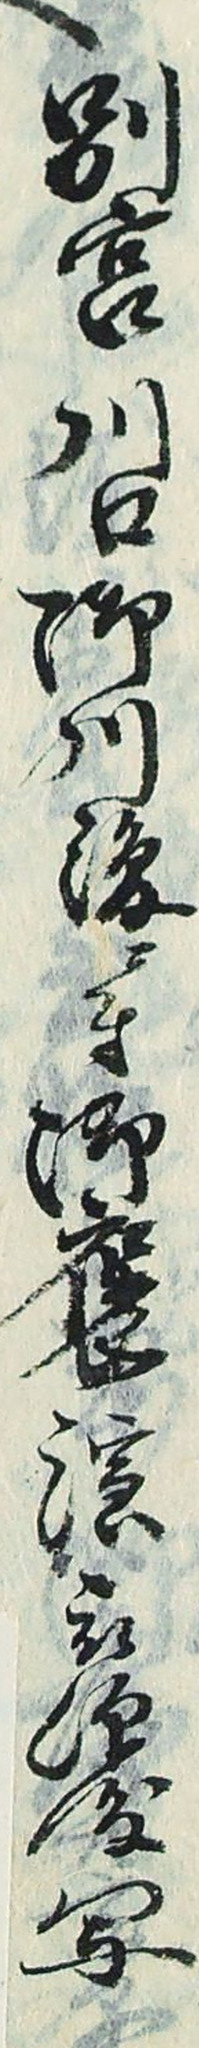○別宮川口御川浚ニ付御褒演被仰渡写
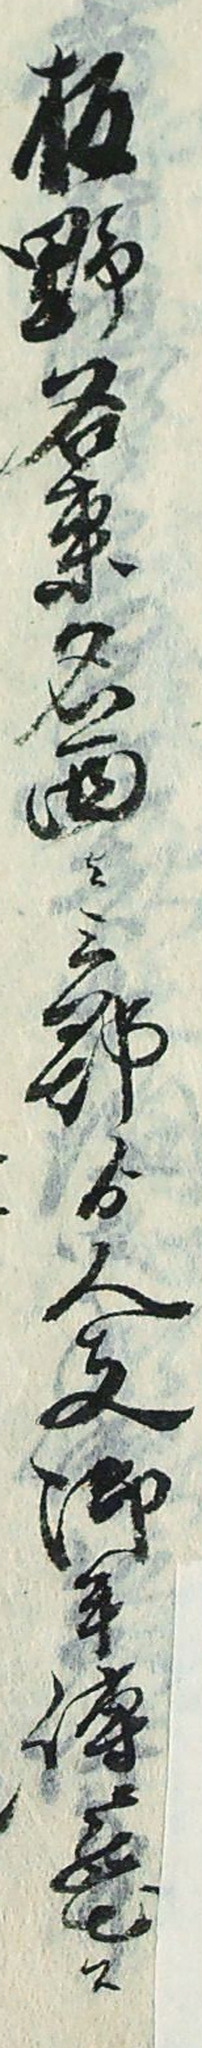板野名東名西之三郡ゟ人夫御手傳ニ罷出候
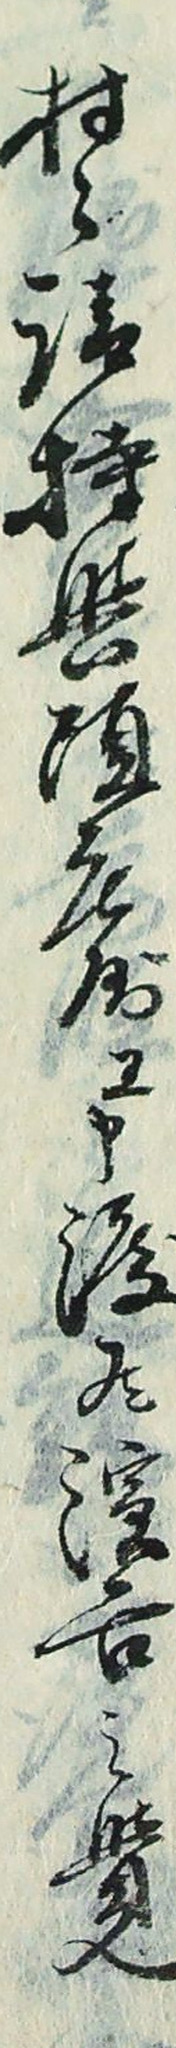村々請持與頭庄屋江申渡候演舌之覺
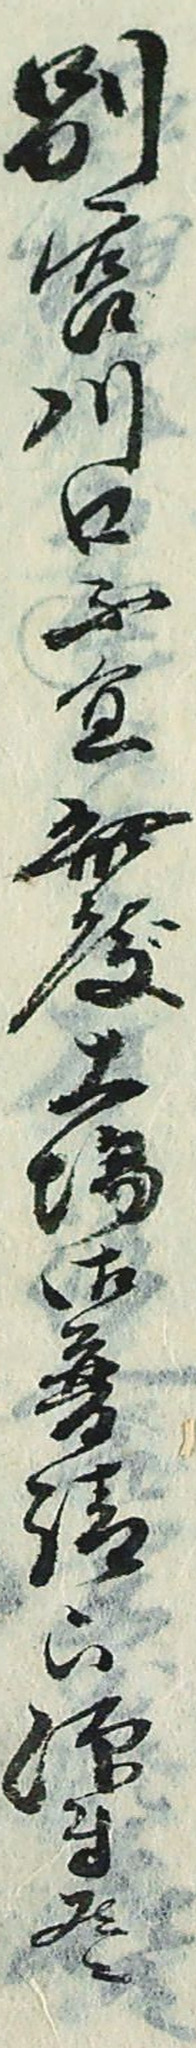別宮川口不宜此度土場御普請被仰付候ニ
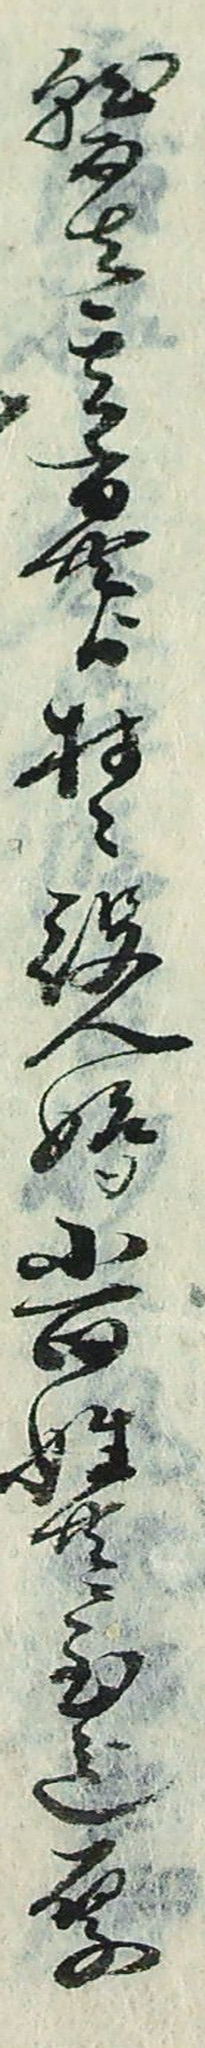就而者其方共ゟ村々役人始メ小百姓共ニ至迄厚
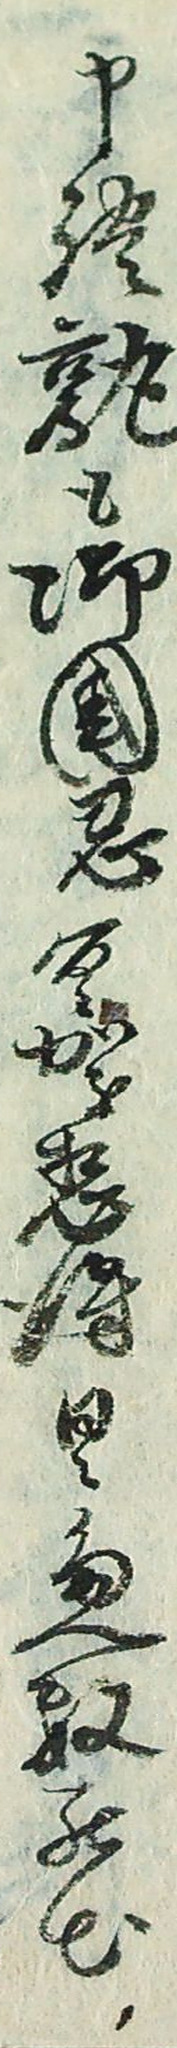申談孰も御国恩冥加を相心得日々多人数罷出
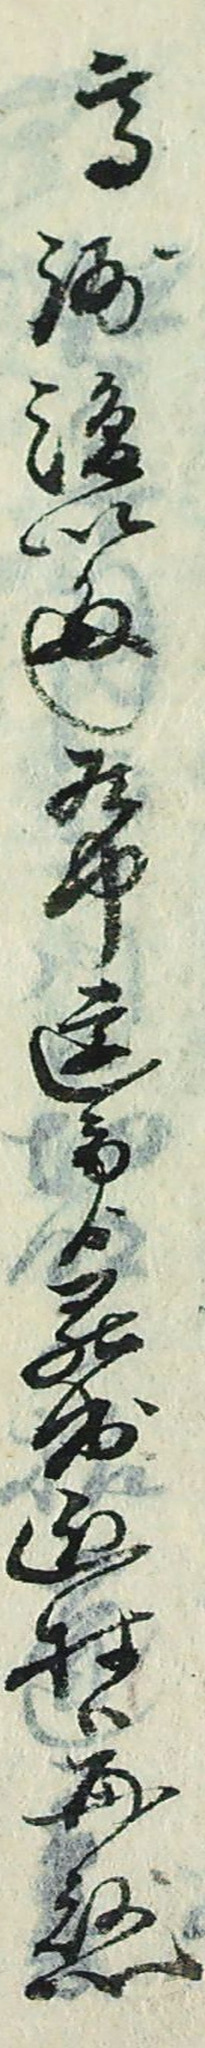高洲浚いたし候中遠方ゟ罷出近村ハ再應
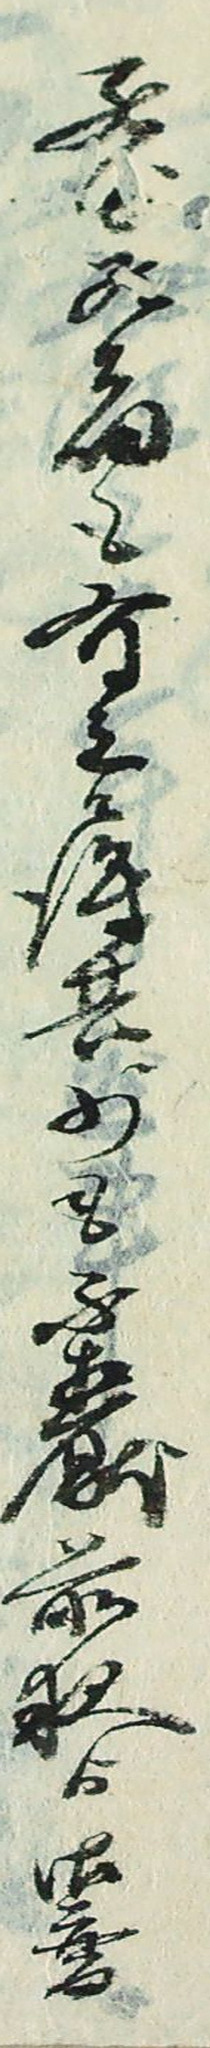罷出候者も有之候得共少も不相厭前夜ゟ御普
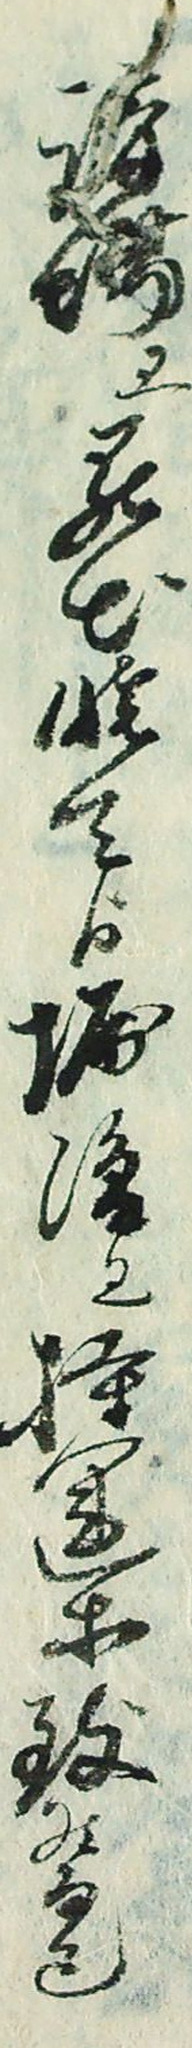請場え罷出暁天ゟ堀浚え持運等致候而已
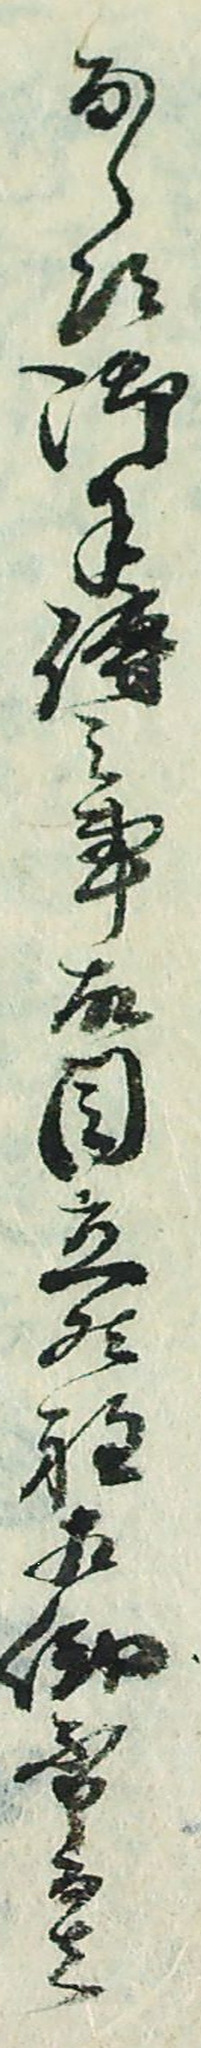ならす御手傳之事故目立候程相働不申而者
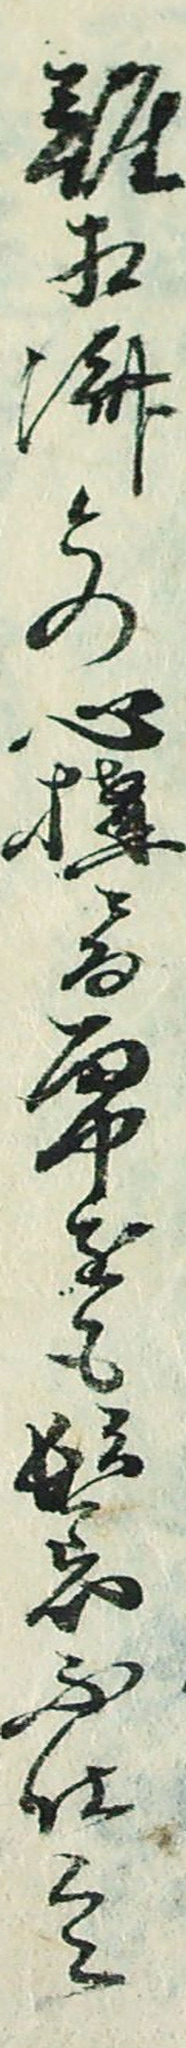難相済との心構ニ而雨中をも頓着不仕令
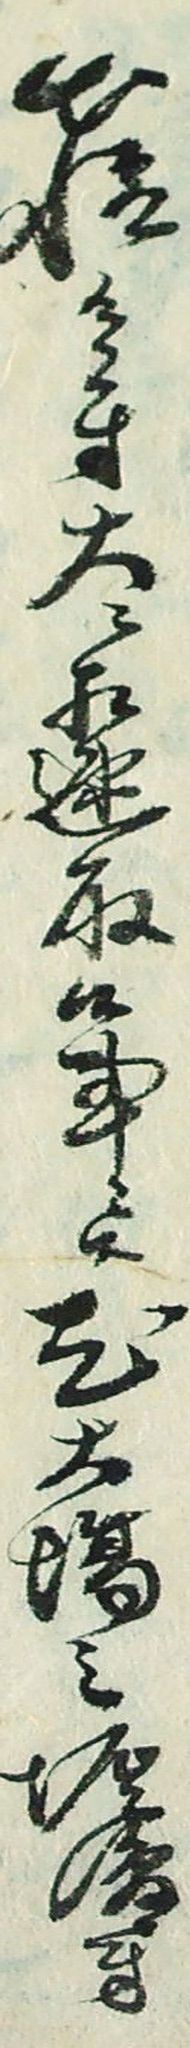出精候ニ付大ニ相速取候事ニ候尤土場之堀浚ニ付
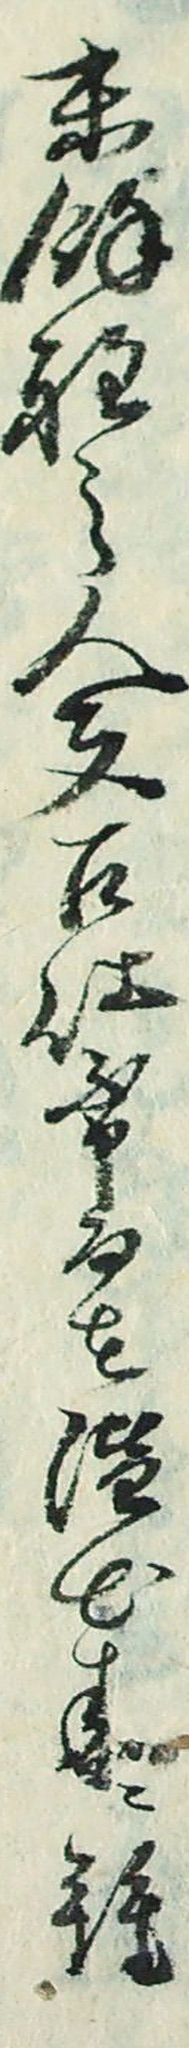未餘程之人夫召仕不申而者階出来ニ難
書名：諸御趣意書并御下知向之写
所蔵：鳴門教育大学 Naruto University of Education
